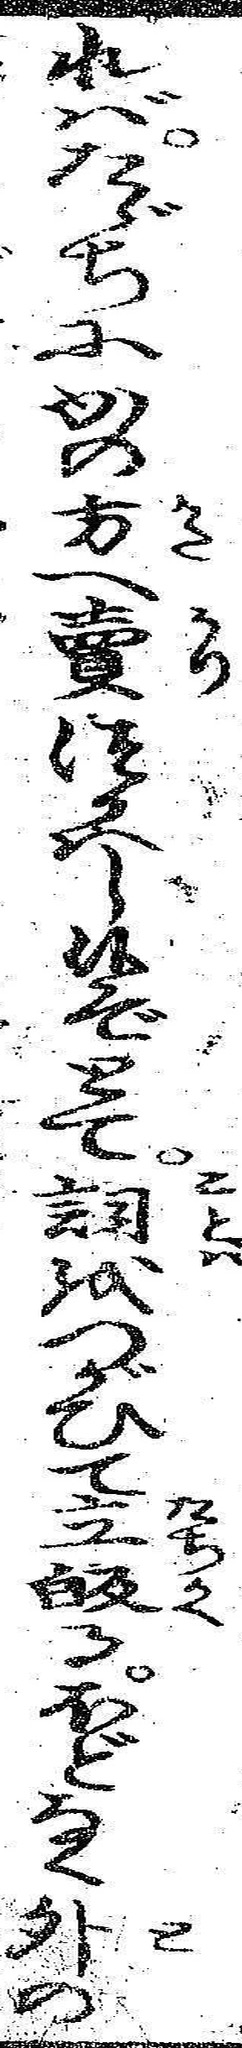れば。たゞちにかの方へ売つかはし候ぞとて。詞をつがひて立帰る。ほどなく外の
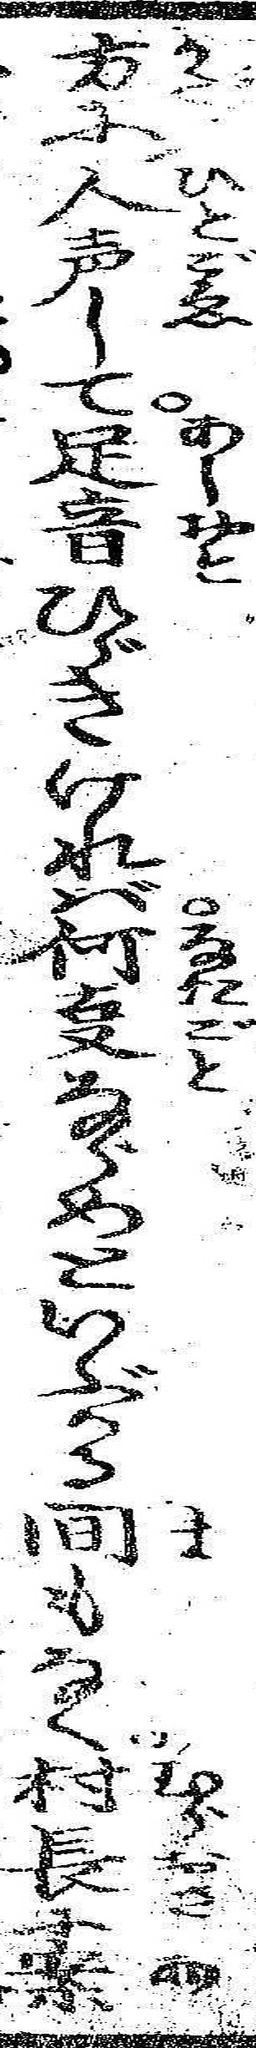方に人声して。足音ひゞきければ。何事ならめといぶかる間もなく。村長に案
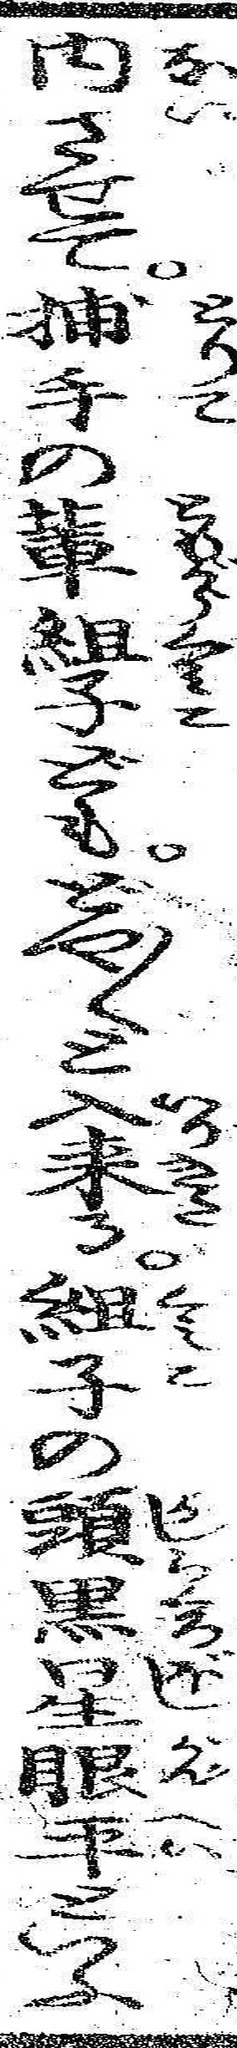内させて。捕手の輩組子ども。どや〳〵と入来る。組子の頭黒星眼平といふ

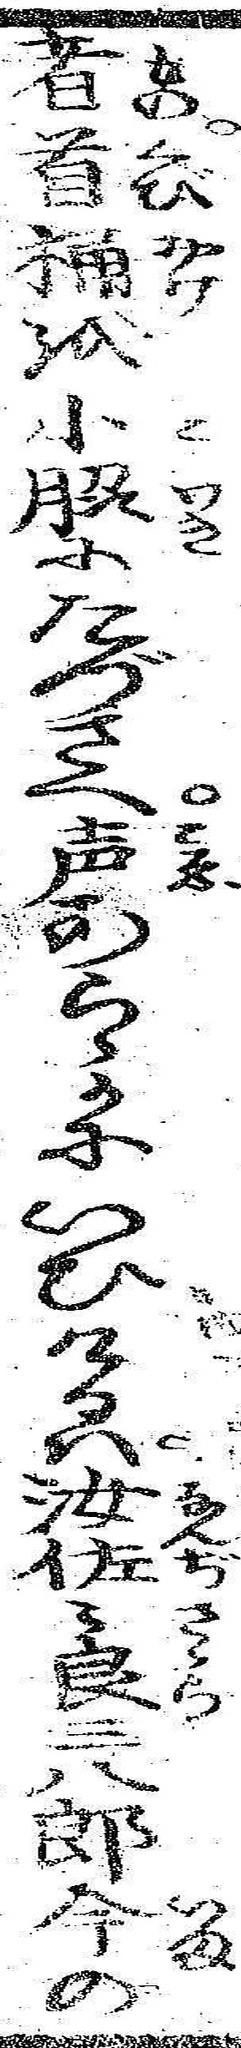者。首桶を小脇にたづさへ。声あらゝかにいひけるは。汝佐々良三八郎今の
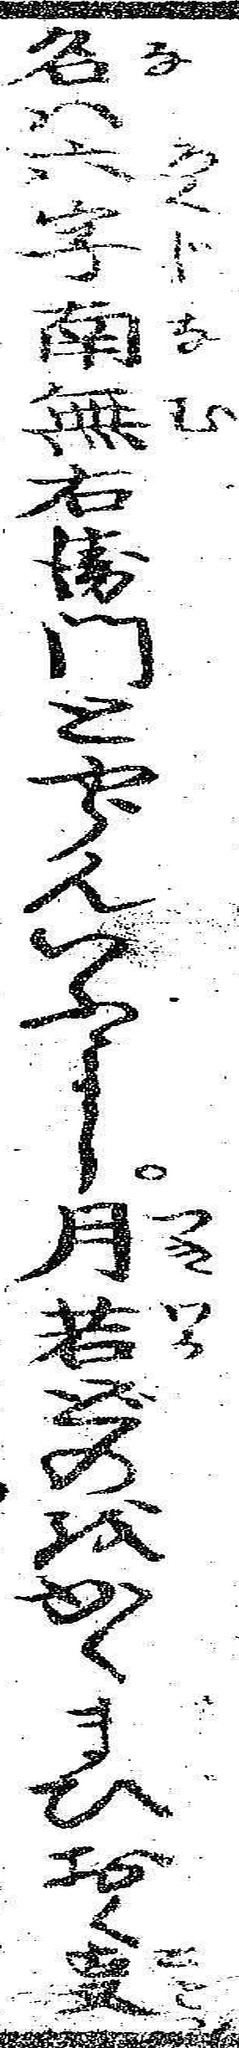名は六字南無右衛門とやらんいふよし。月若どのをかくまひおく事。
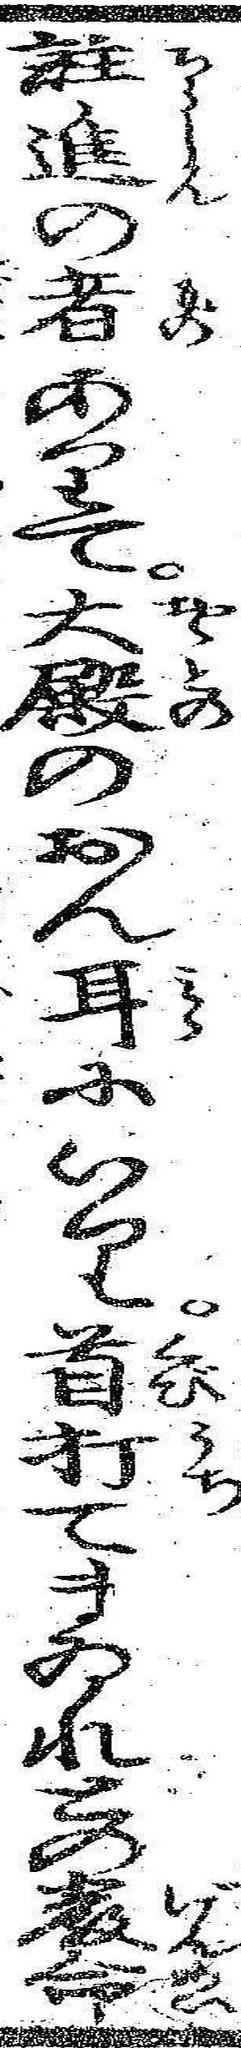註進の者ありて。大殿のおん耳にいり。首打てまゐれとの厳命
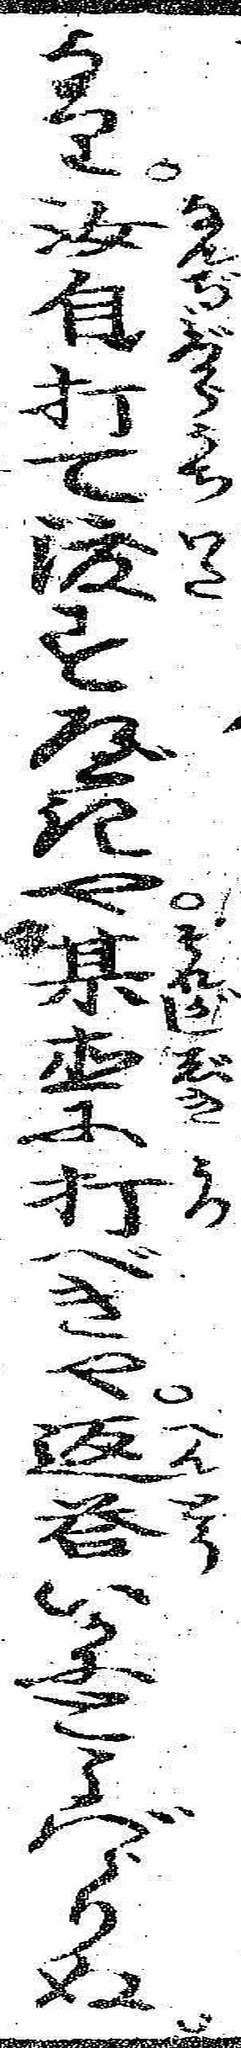なり。汝自打て渡すべきや。某直に打べきや。返荅いかにとよばゝりぬ。
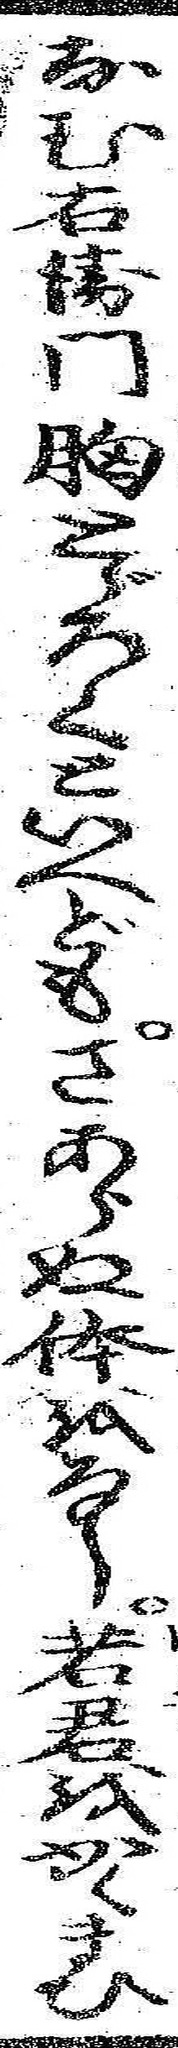なむ右衛門胸とゞろくといへども。さあらぬ体をなし。若君をかくまひ
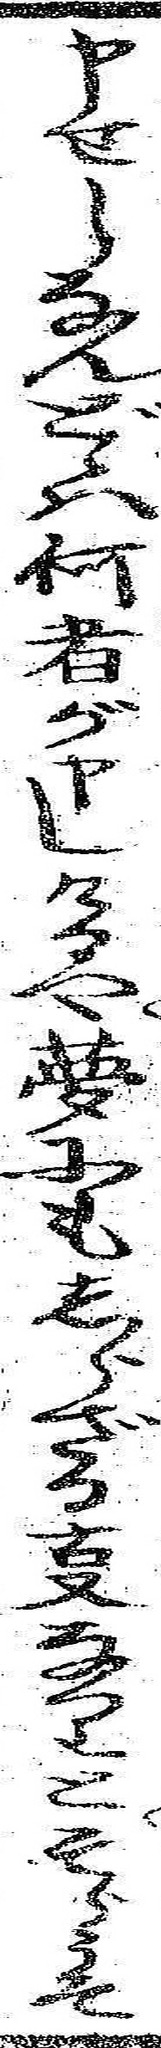申せしなんどゝは。何者が申しけるや。夢にもしらざる事なりと。そらうそ
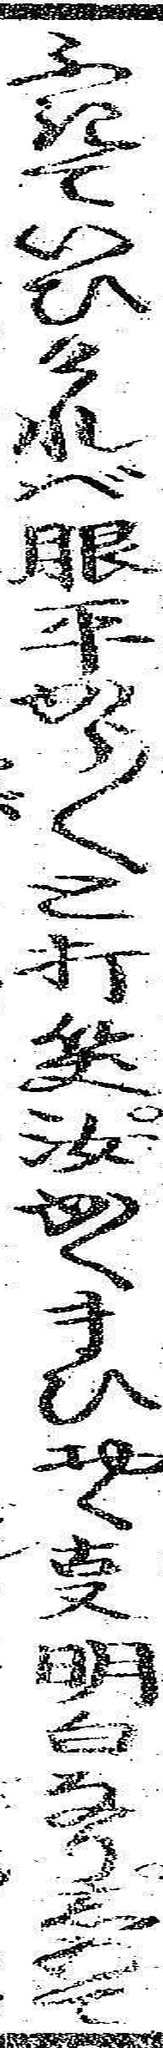ふきていひければ。眼平から〳〵と打笑。汝かくまひおく事明白なり。しゐて
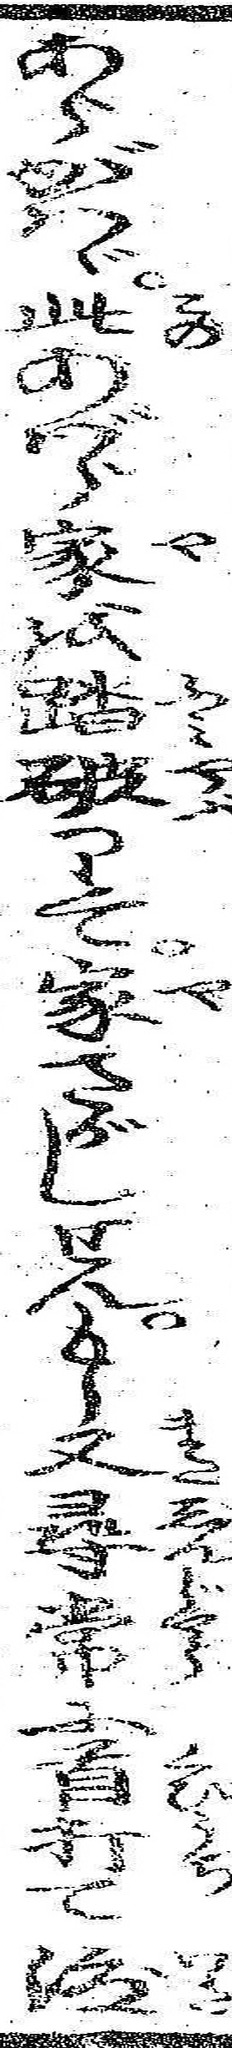あらがはゞ。此あばら家を踏破りて。家さがしせん。もし又尋常に首打て渡
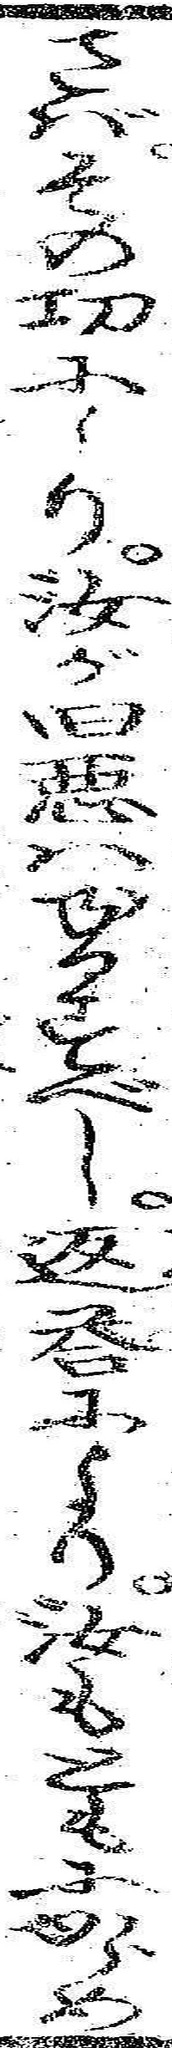さば。その㓛にしり。汝が旧悪はゆるすべし。返荅により。汝もともにからめ
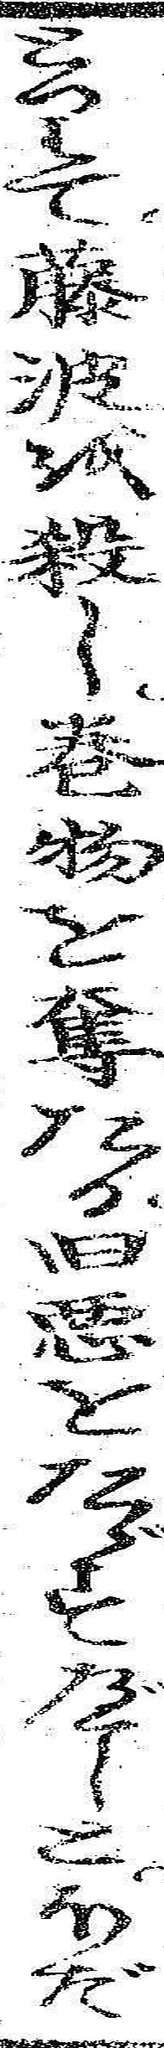とりて。藤波を殺し。巻物を奪たる。旧悪をたゞすべしと。ほだ
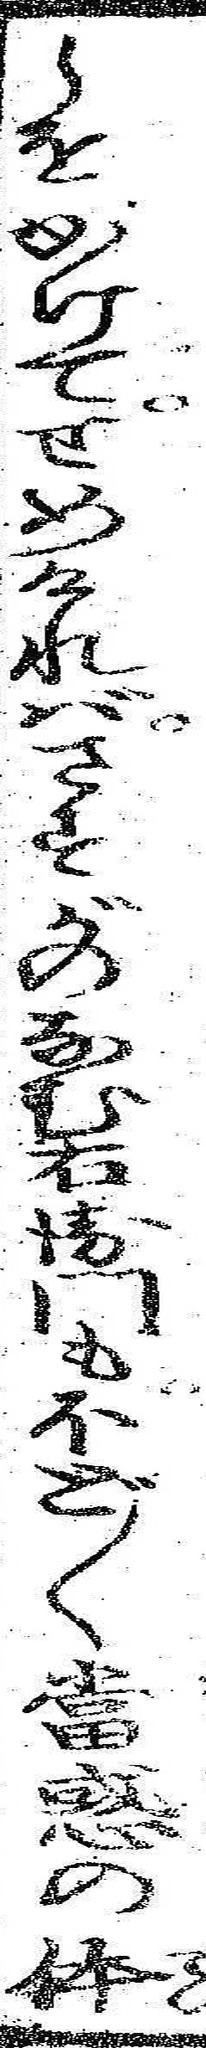しをかけて。せめければ。さすがのなむ右衛門も。ほど〳〵当惑の体
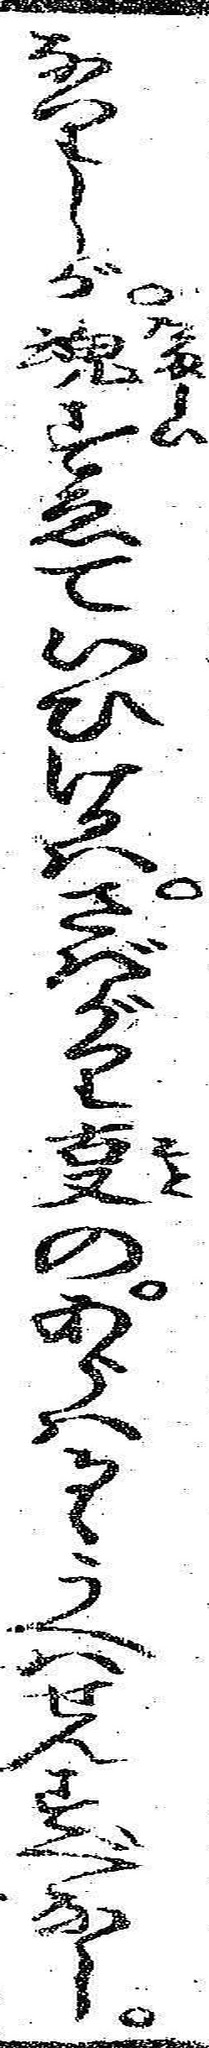なりしが。魂すゑていひけるは。さばがり事の。あらはるゝうへはせんすべなし。
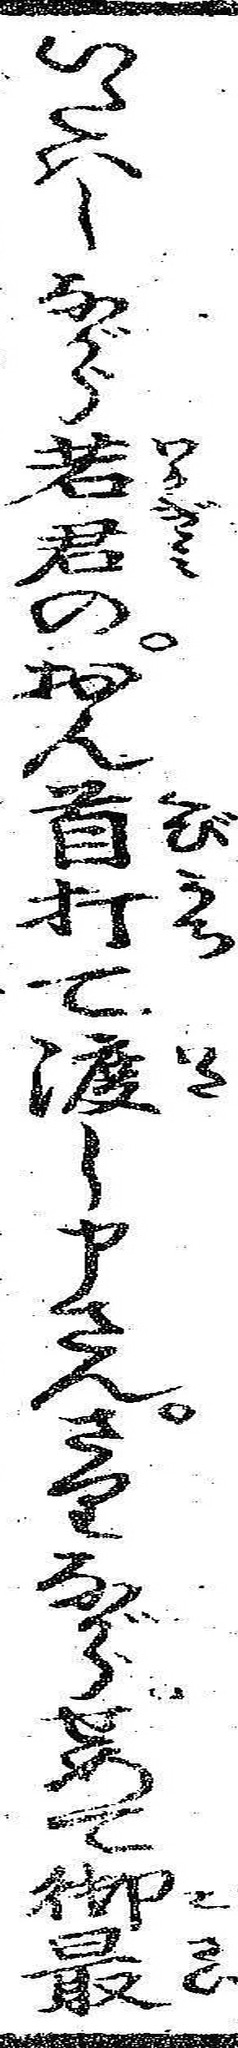いたはしながら若君の。おん首打て渡し申さん。さりながら。せめて御最
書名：昔話稲妻表紙
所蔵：国文学研究資料館
